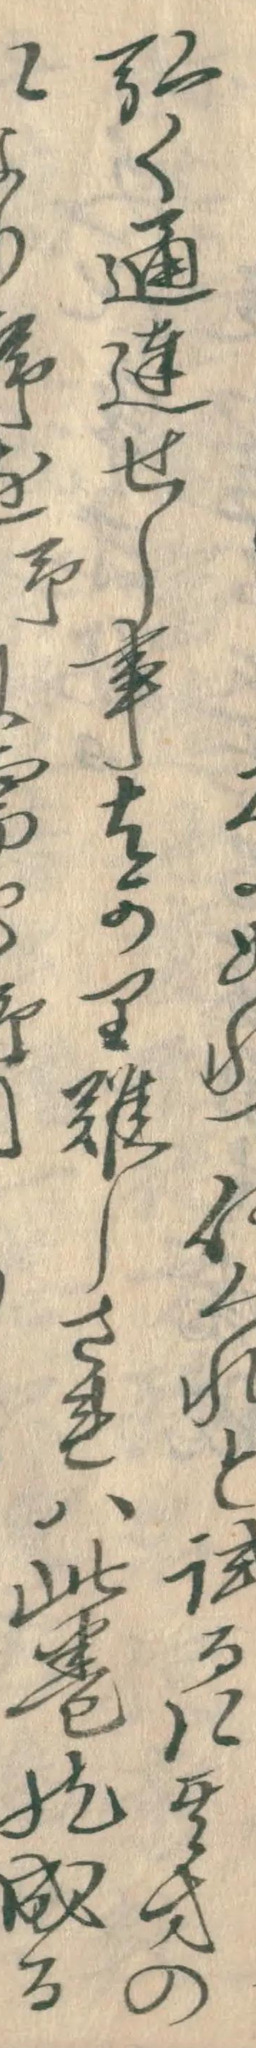弘く通達せし事はかり難しされは此巻の成る
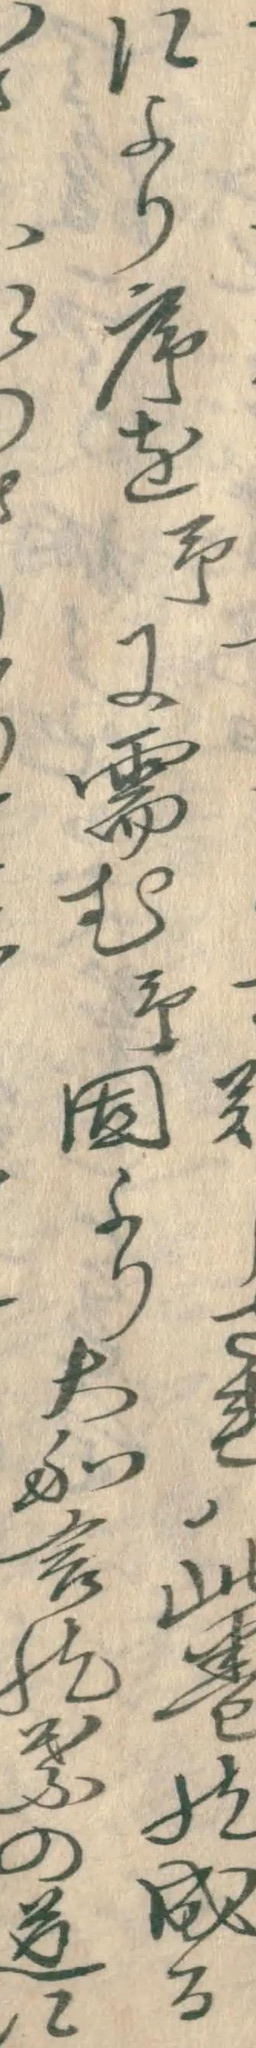により序を予に需む予固より大和言の葉の道に
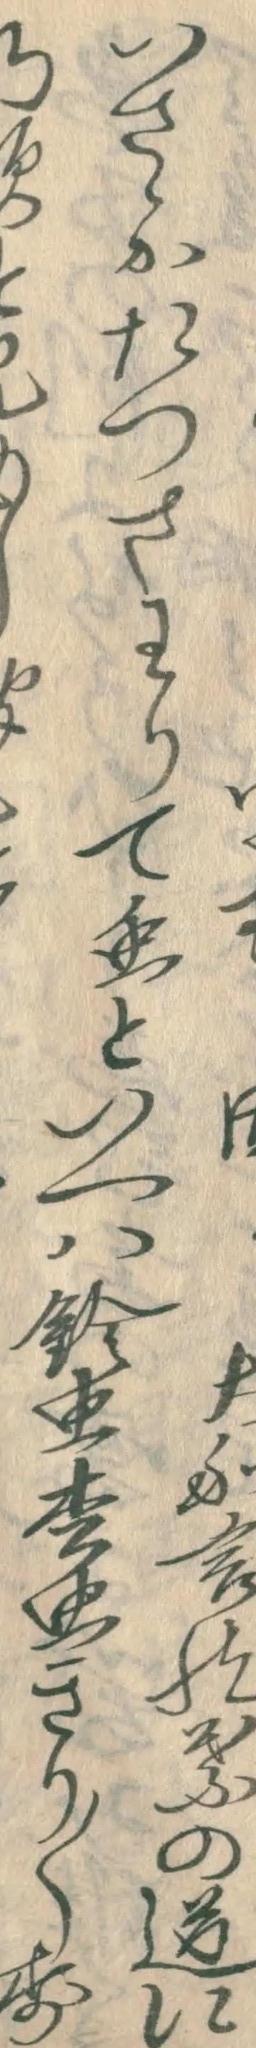いさゝかたつさわりて虫といへは鈴虫松虫きり〳〵す
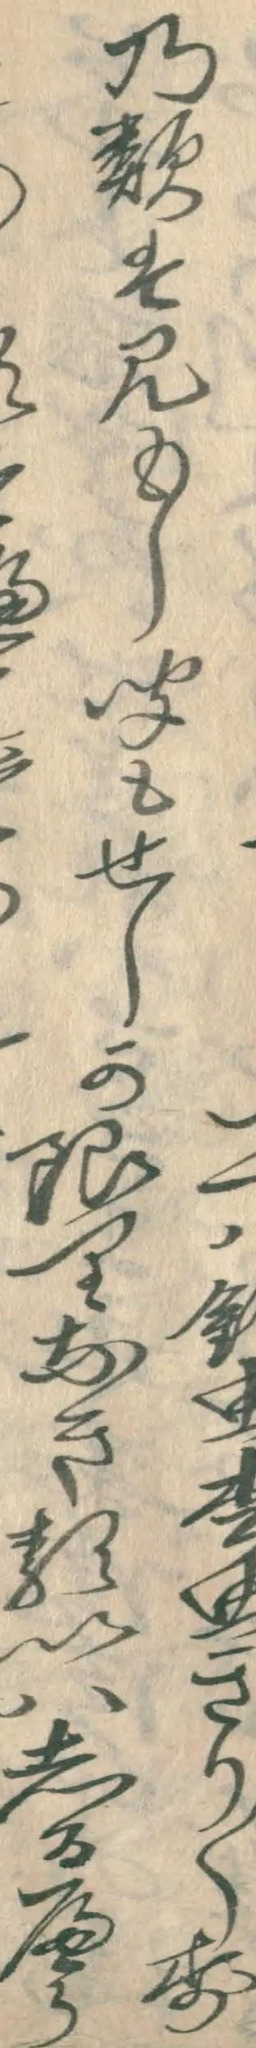の類は見もし聞もせしか限りなきるいはしるへう
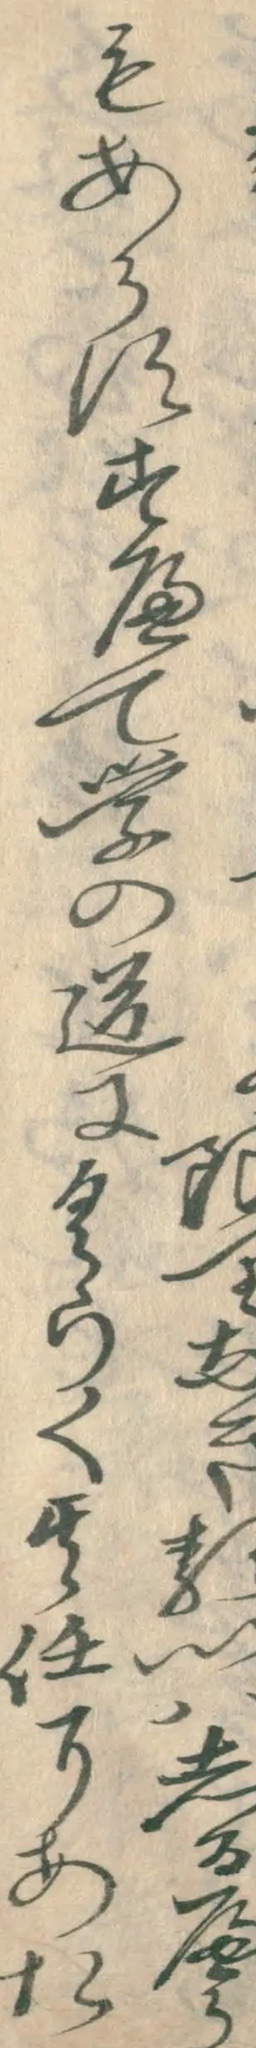もあらすすへて学の道にくらく其任にあた

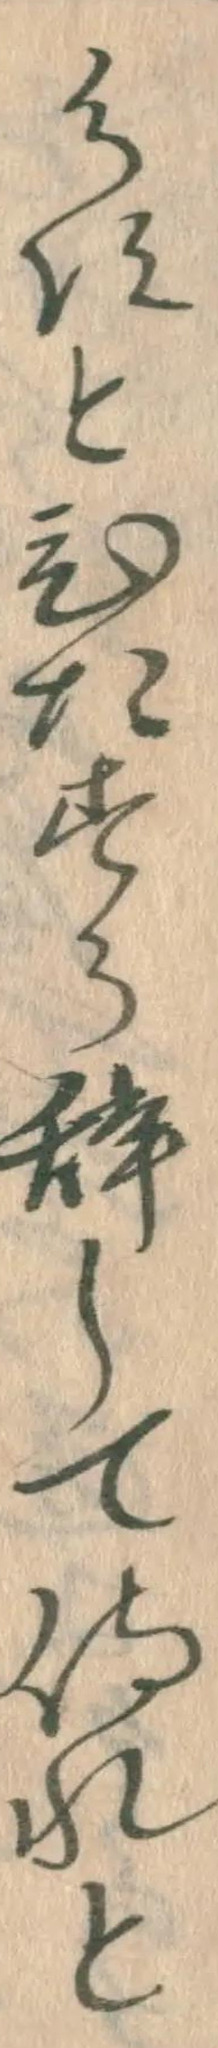らすとひたすら辞して侍れと
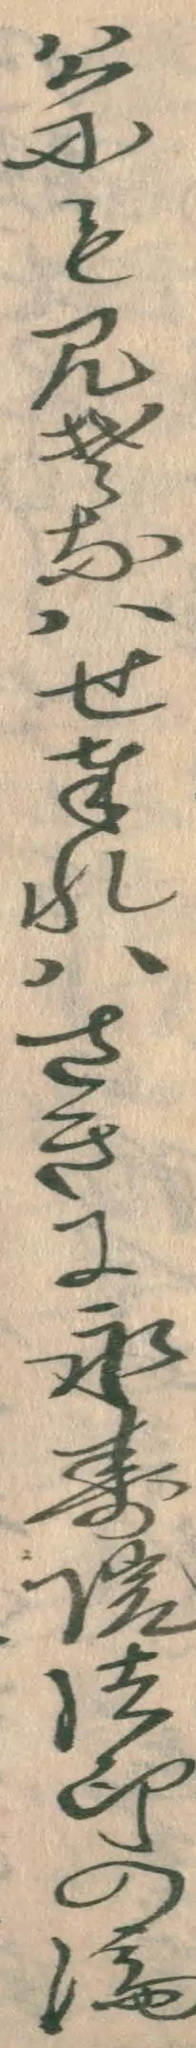公にも見そなはせ奉れはさきに永寿院法印の済
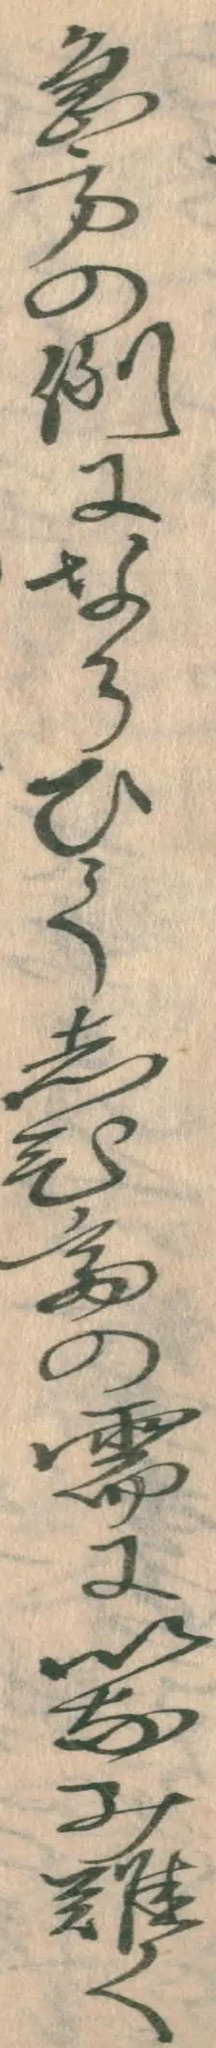急方の例にならひてしひての需にいなみ難く
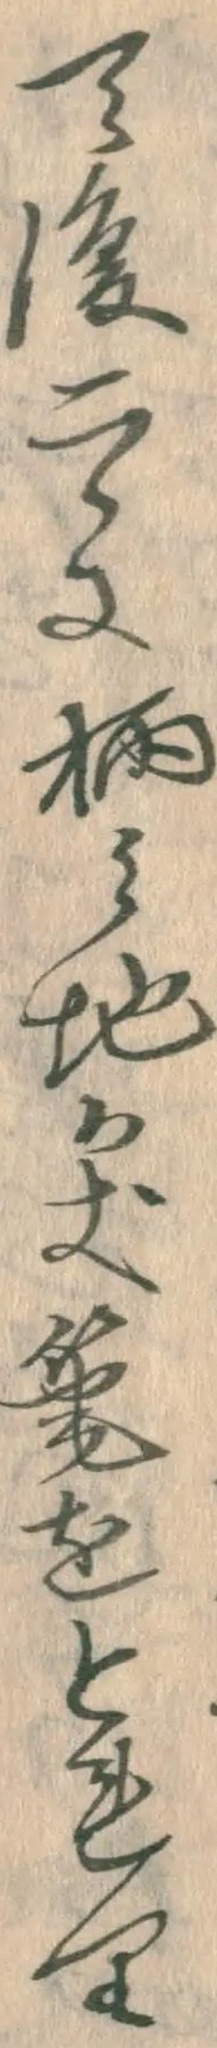て復こゝに柄みちかき筆をとれり
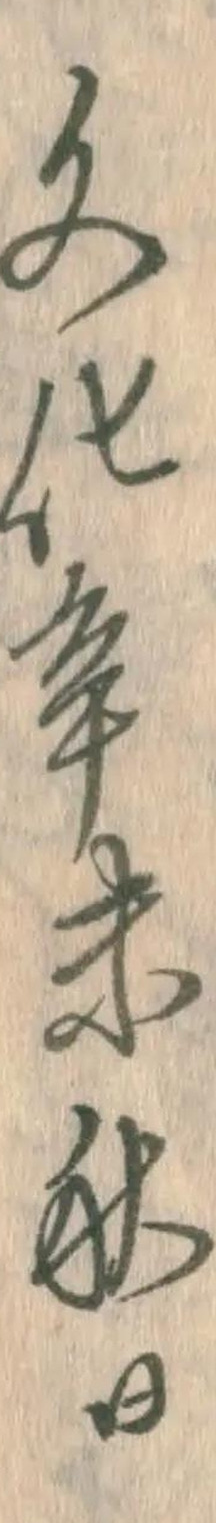文化辛未秋日
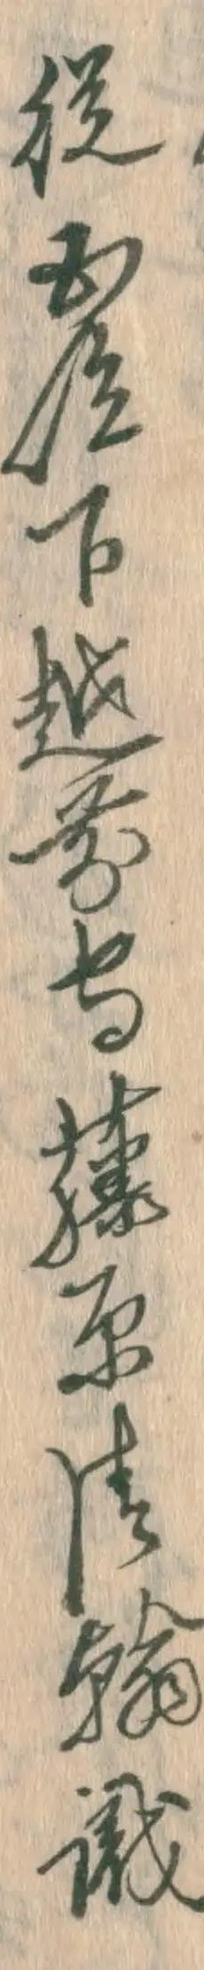従五位下越前守藤原清翰識
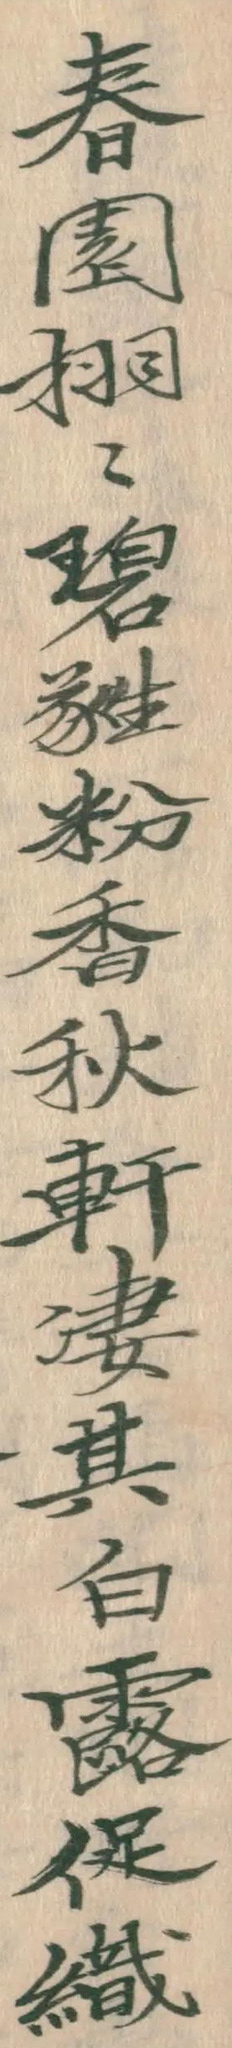春園栩々碧𬎼粉香秋軒凄其白露促織
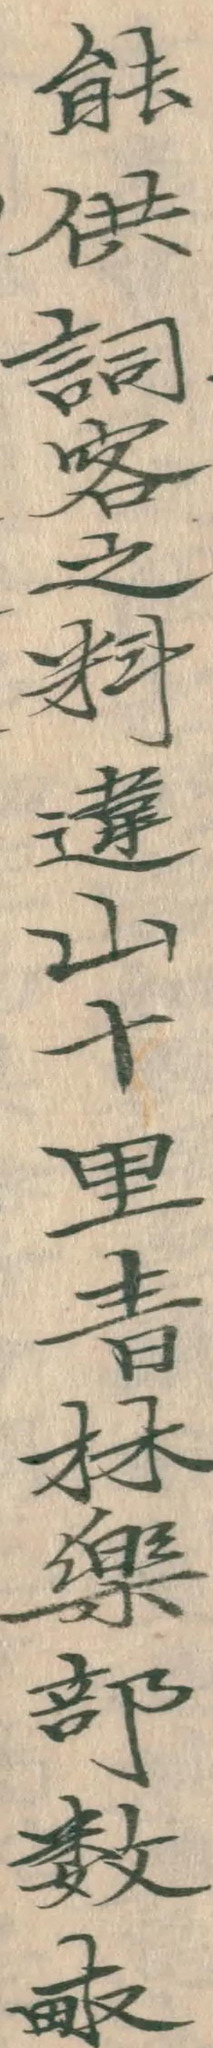能供詞客之料違山十里青林楽部数畞
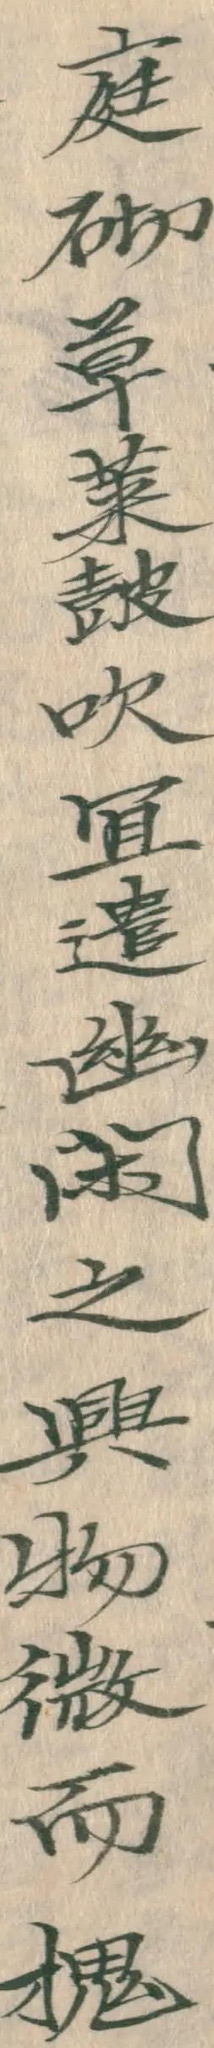庭砌草莱皷吹冝遣幽閑之興物微而槐
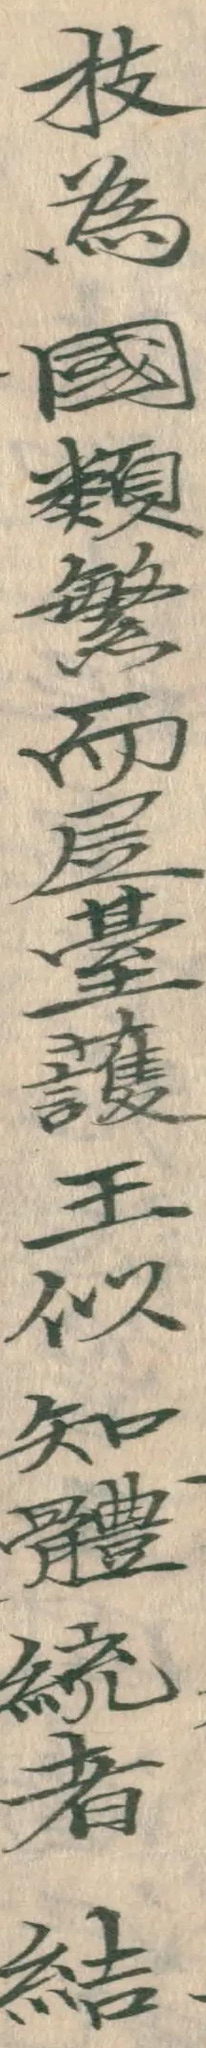枝為國類繁而㞐臺護王似知體統者結
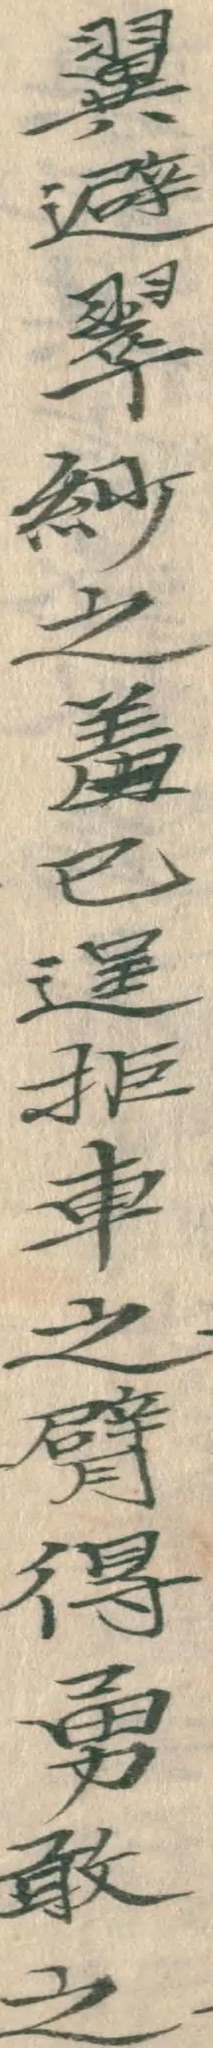翼避翠紗之羞已逞拒車之臂得勇敢之
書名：千蟲譜 3巻. [1]
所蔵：国立国会図書館 National Diet Library, JAPAN
